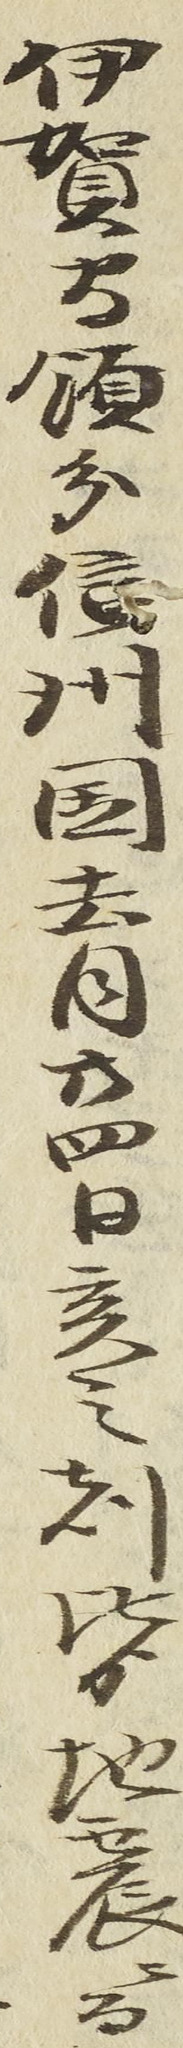伊賀守領分信州国去月廿四日亥之刻比ゟ地震二而
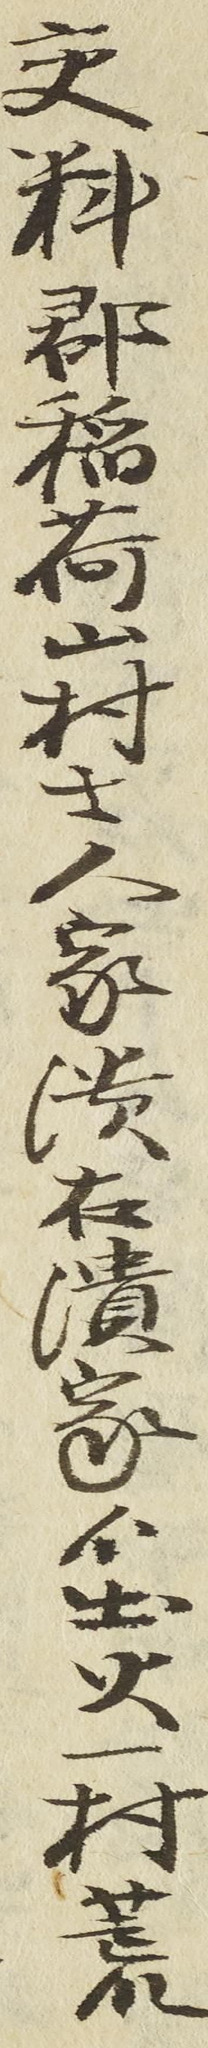更科郡稲荷山村は人家潰右潰家ゟ出火一村荒
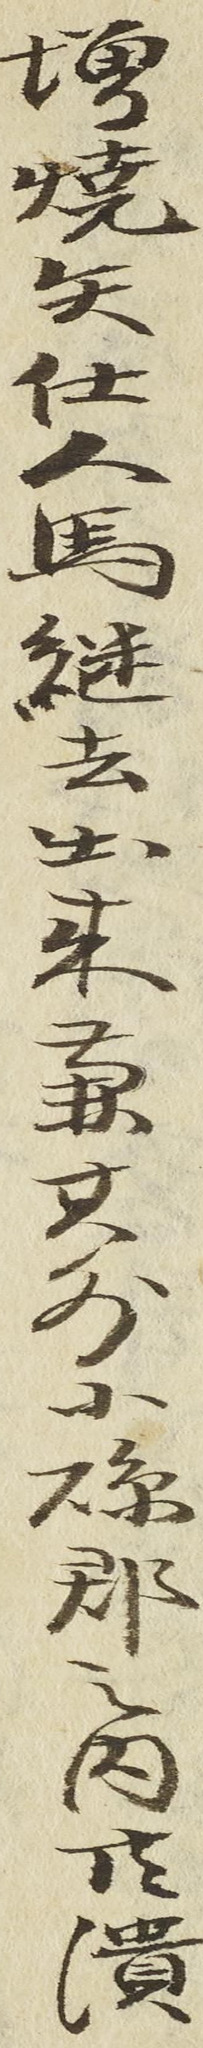増焼矢仕人馬継去出来兼其分小県郡之内共潰
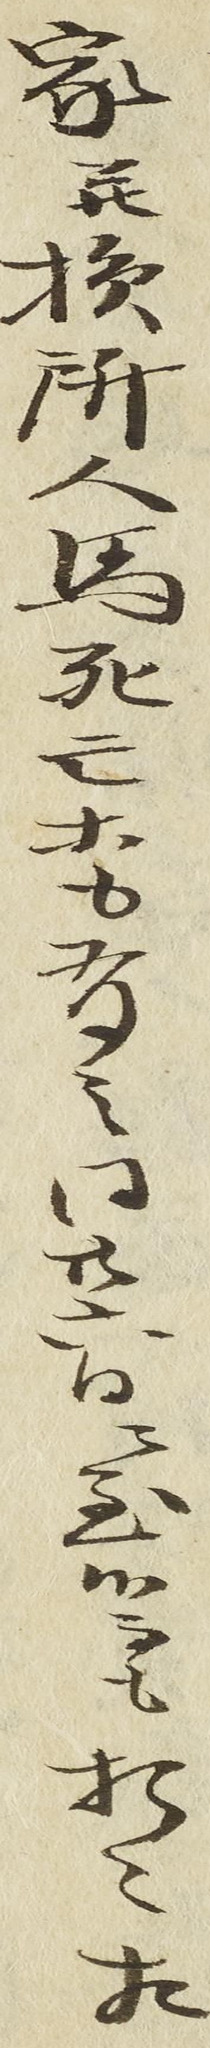家并損所人馬死亡等も有之同廿六日二至候而も折々相
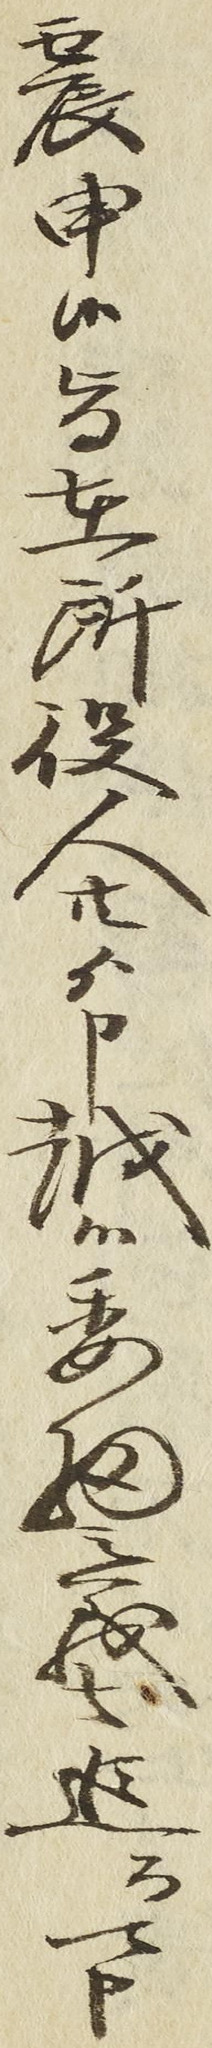震申候旨在所役人共ゟ申越候委細之儀は追而可申
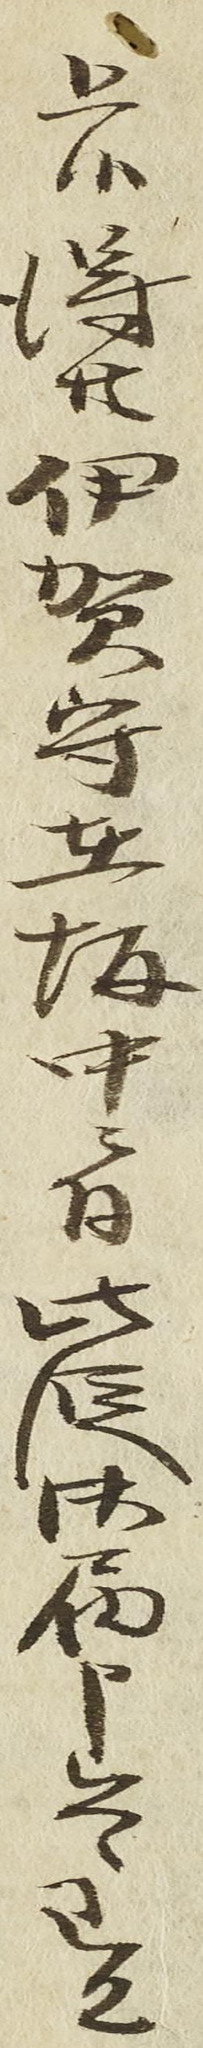上候得共伊賀守在坂中二付此段御届申上候已上
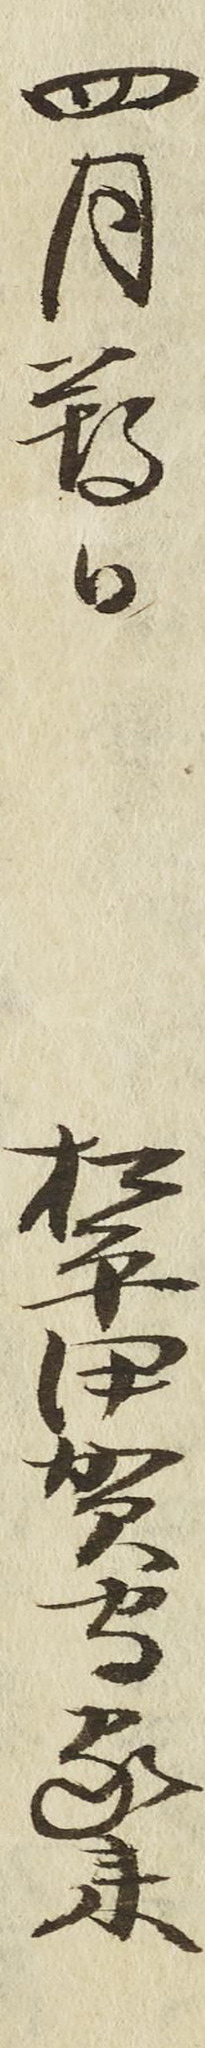四月朔日松平伊賀守家来
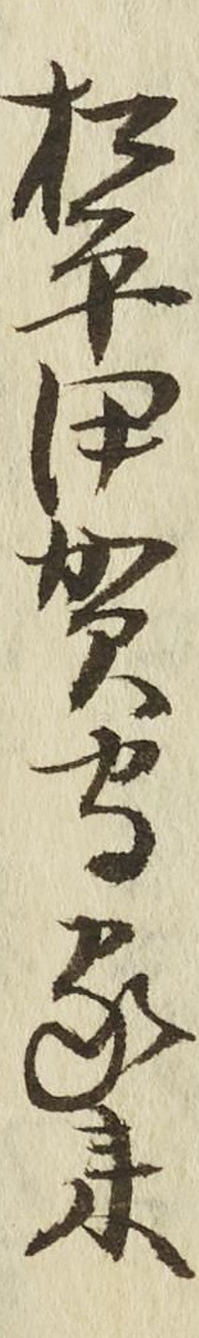四月朔日松平伊賀守家来
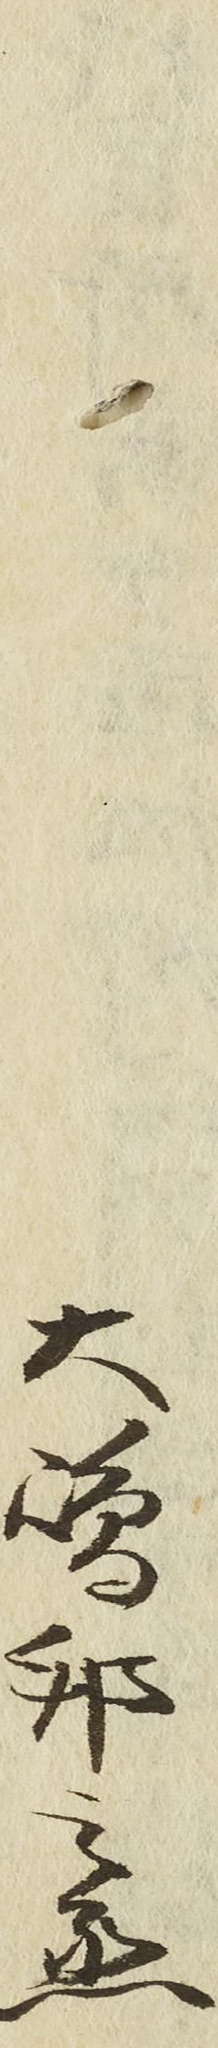大嶋邦之丞
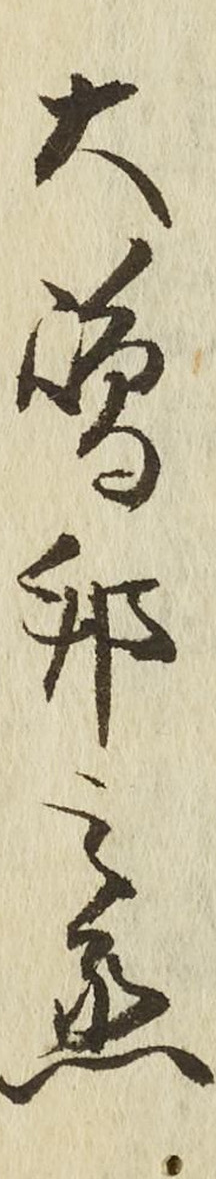大嶋邦之丞
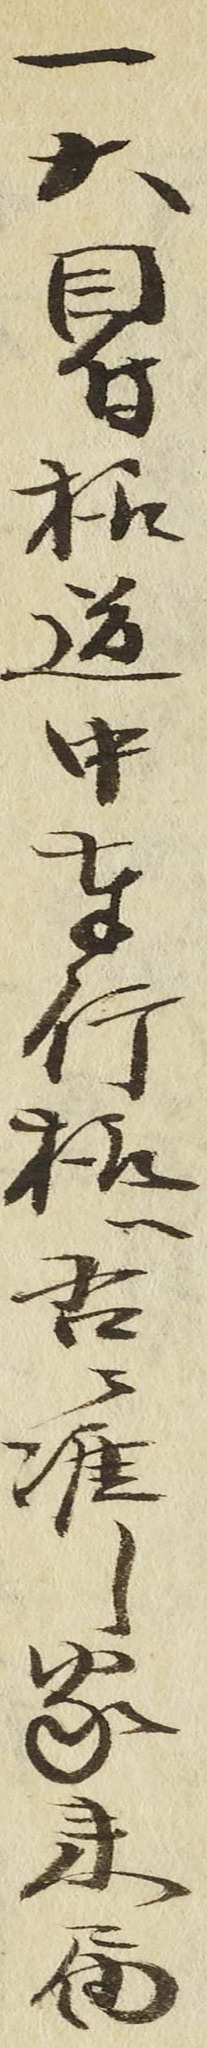一大目付様道中奉行様へ右二準し家来届
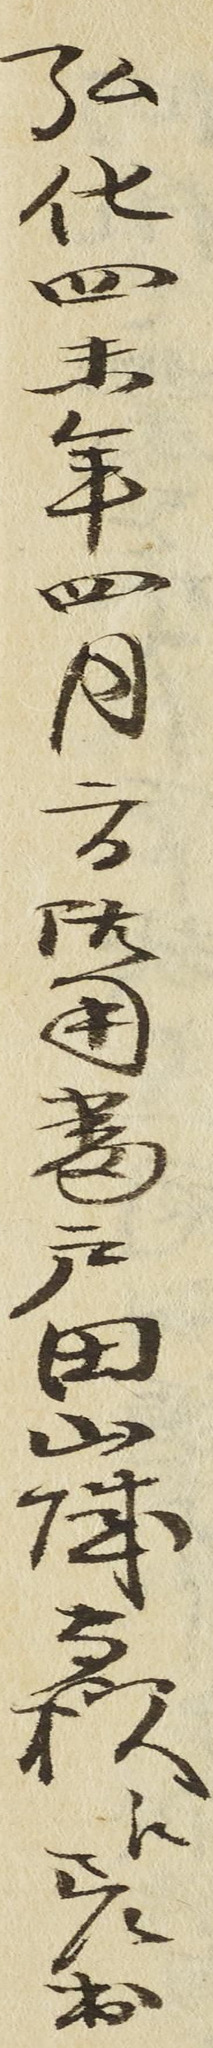弘化四未年四月二日御用番戸田山城守様江届出
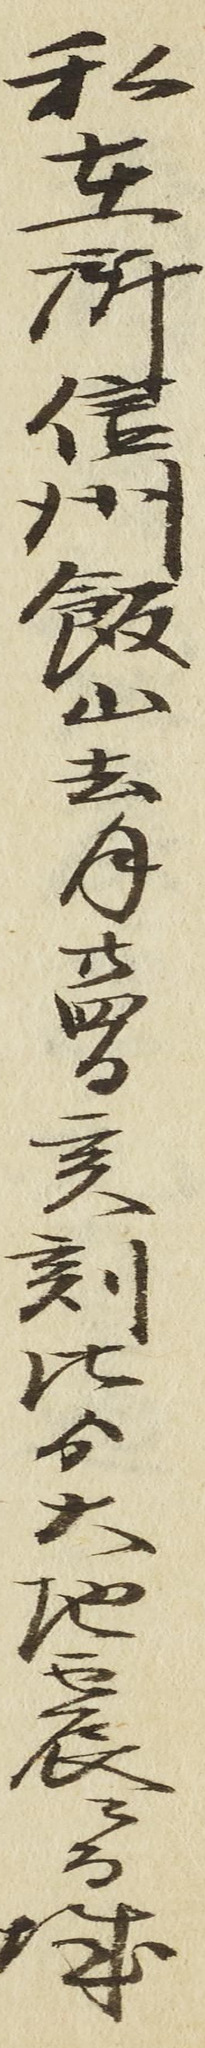私在所信州飯山去月廿四日亥刻比ゟ大地震二而城
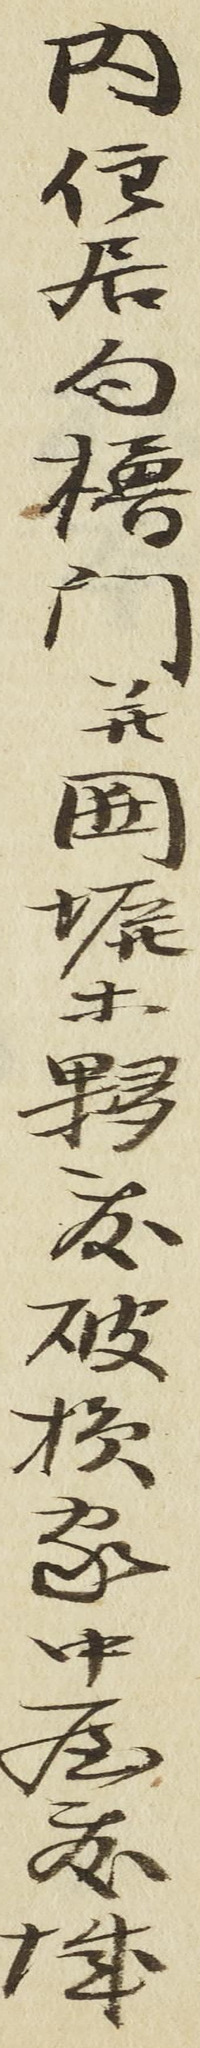内住居向櫓門并囲塀等夥敷破損家中屋敷城
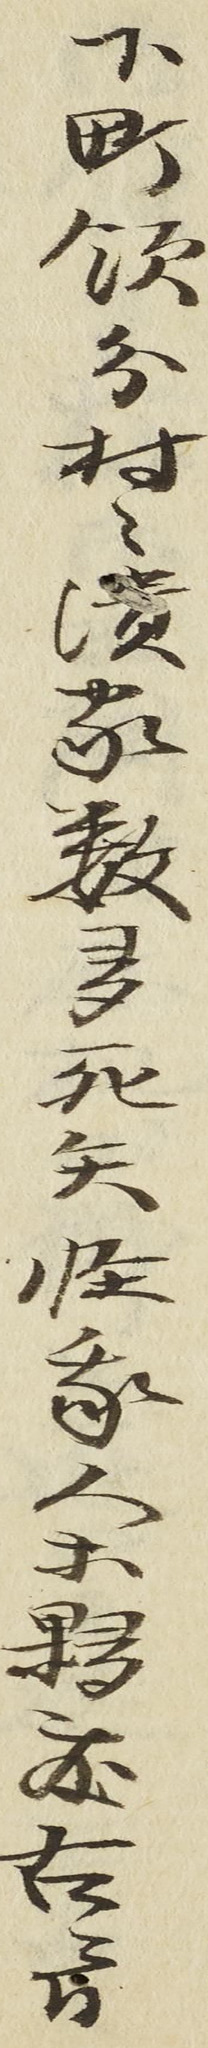下町領分村々潰家数多死矢怪我人等夥敷右二付
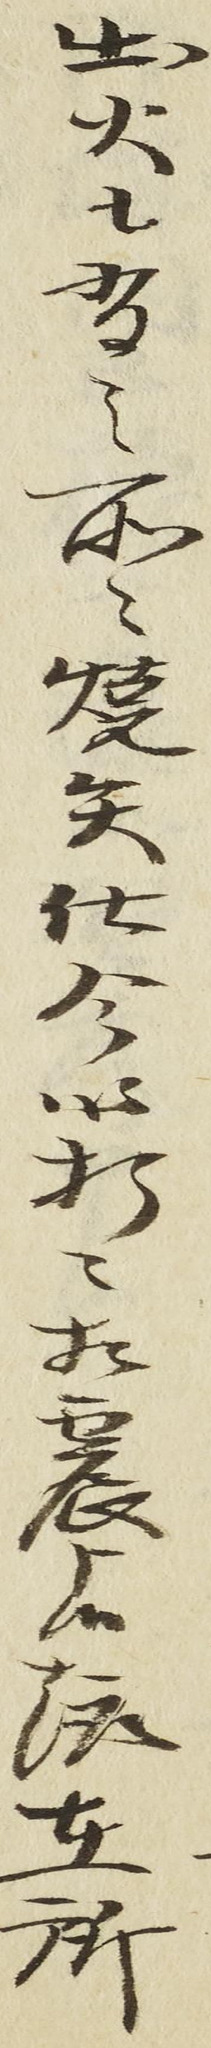出火も有之所々焼矢仕今以折々相震申候趣在所
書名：信濃國大地震記　乾
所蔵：東京大学地震研究所図書室 Earthquake Research Institute Library, The University of Tokyo, JAPAN
